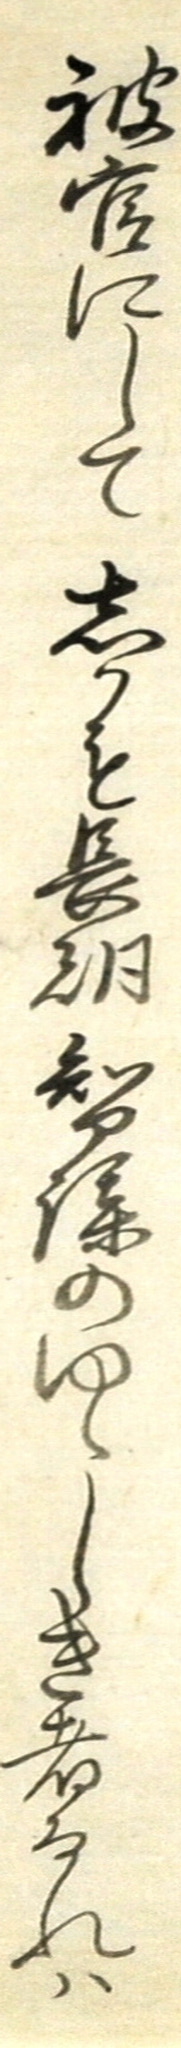被官にしてしかも長朝智謀のゆゝしき者なれは
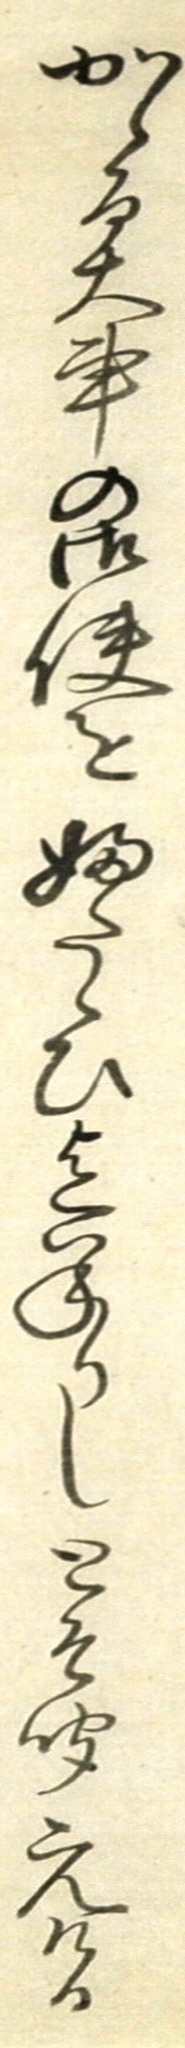かゝる大事の御使をふたゝひ迄承りしとそ聞えける
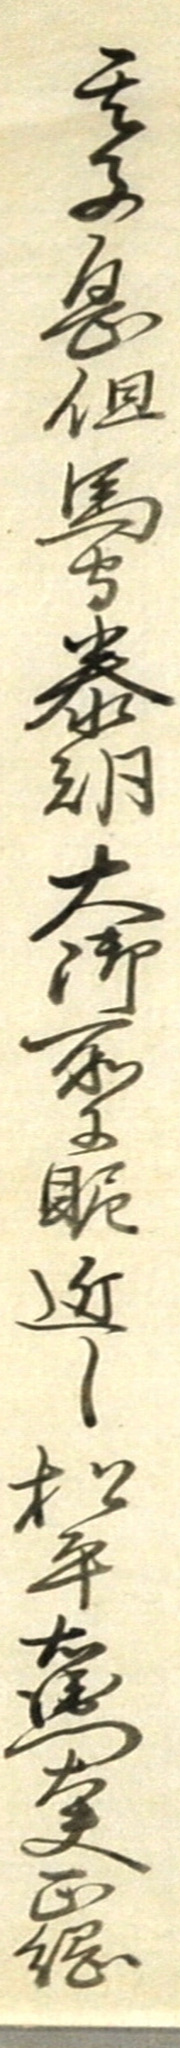其子息但馬守泰朝大御所に昵近し松平右衛門大夫正綱

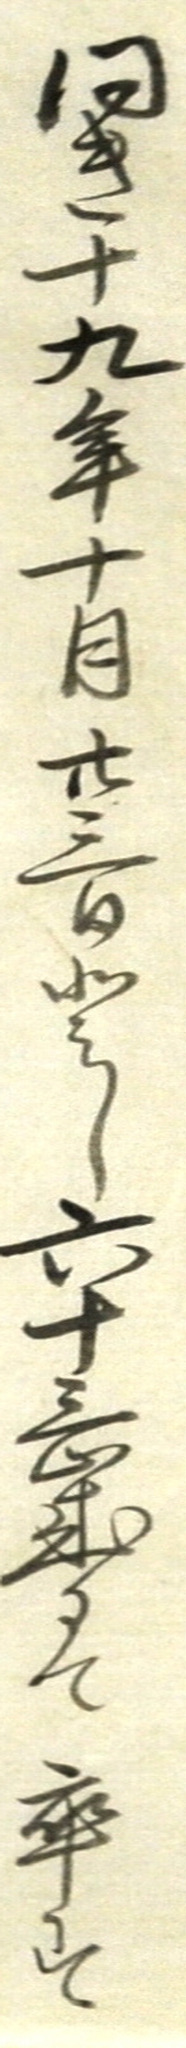堂き十九年十月廿三日とし六十三歳にて卒す
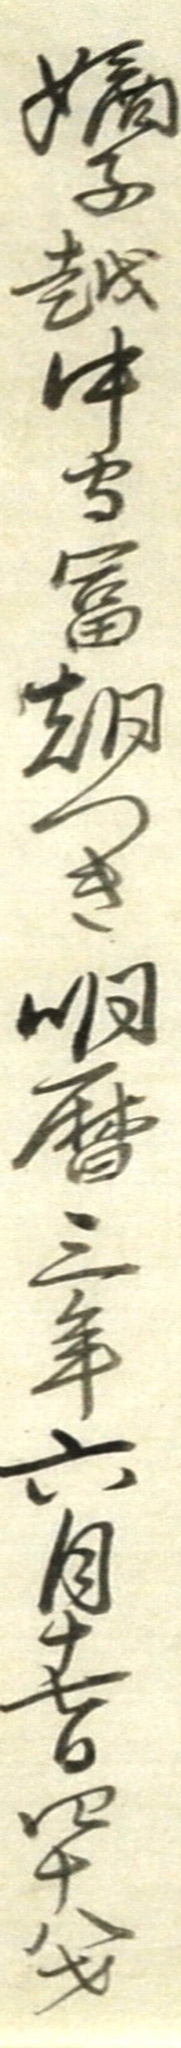嫡子越中守富朝つき明暦三年六月十七日四十八才
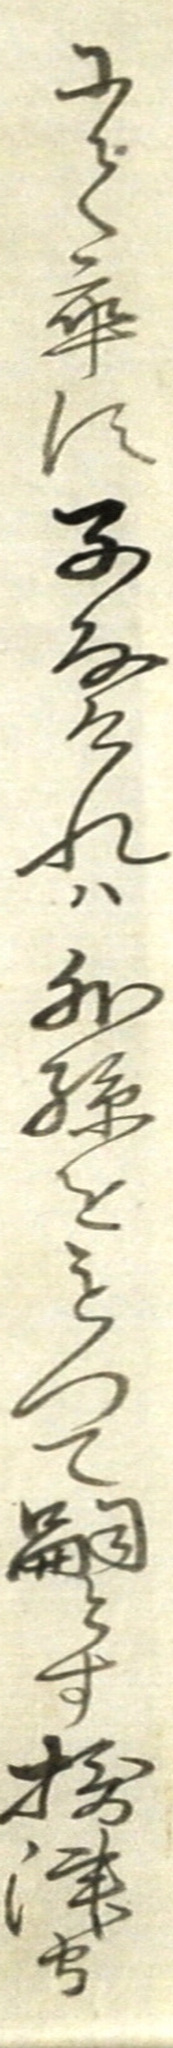にて卒す子なけれは外孫をもつて嗣とす摂津守
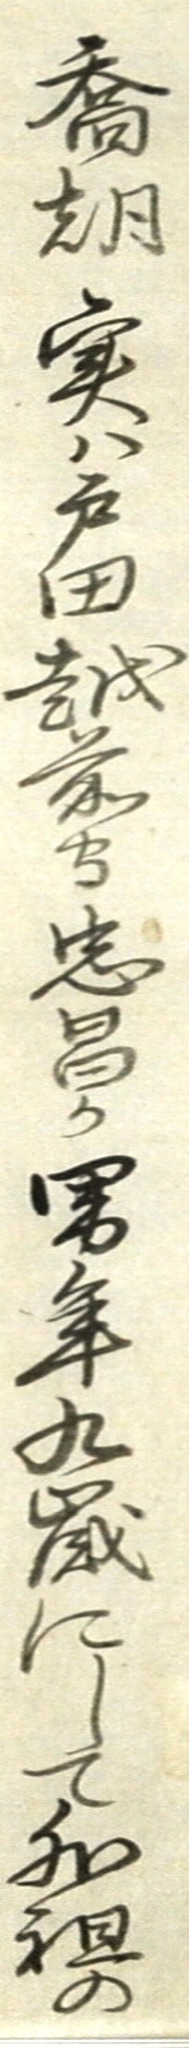喬朝実は戸田越前守忠昌か男年九歳にして外祖の
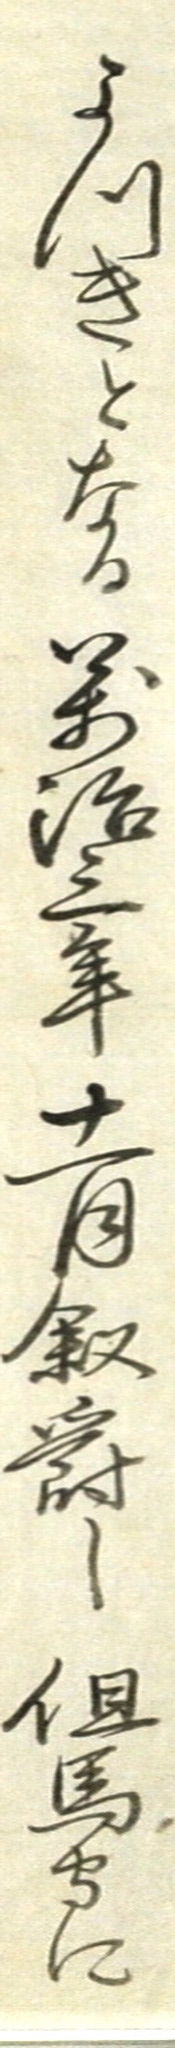よつきとなる万治三年十一月叙爵し但馬守に
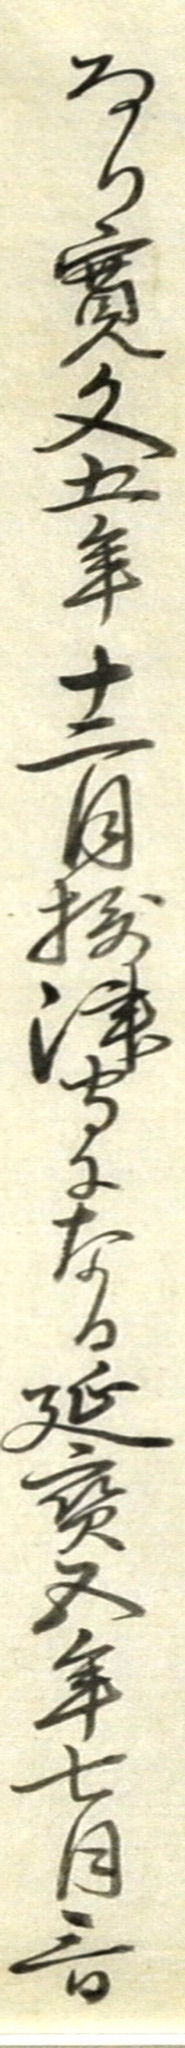なり寛文五年十二月摂津守になる延宝五年七月三日
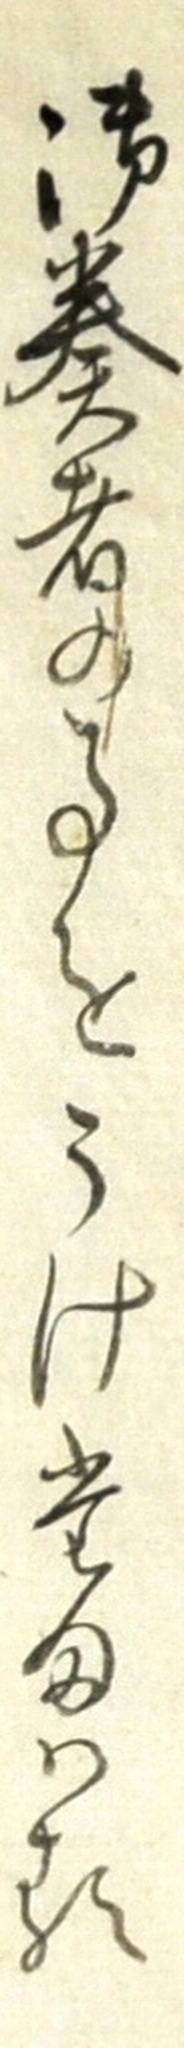御奏者の事をうけたまはる
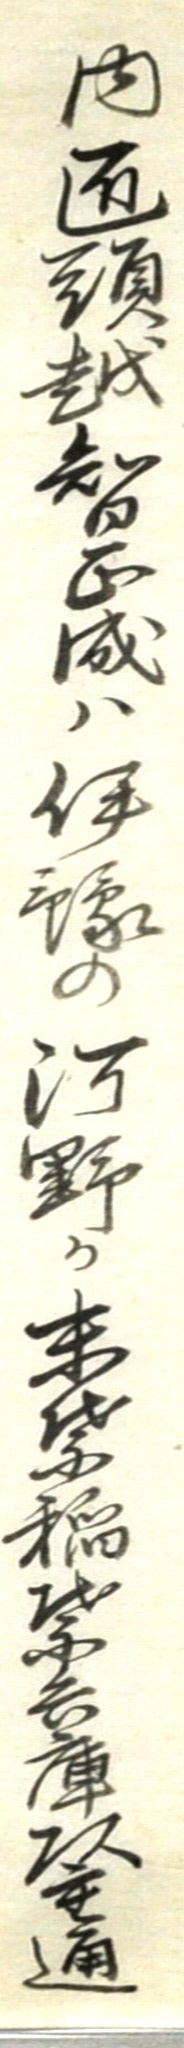内匠頭越智正成は伊予の河野か末葉稲葉兵庫頭重通
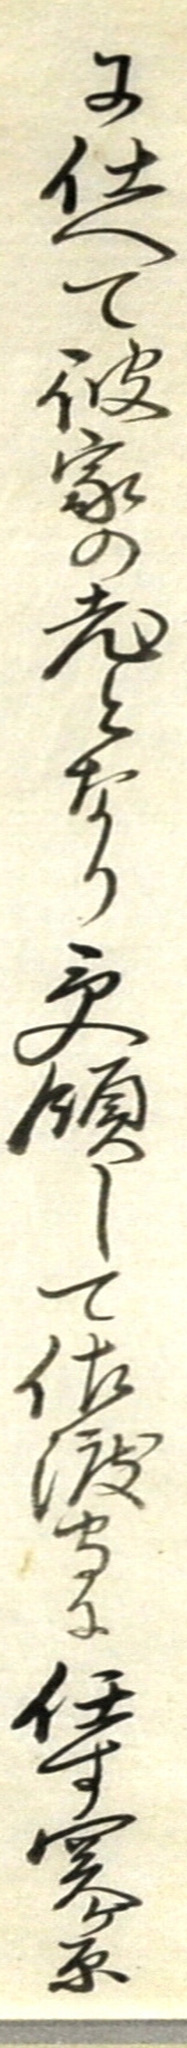に仕へて彼家の老となり受領して佐渡守に任す関ヶ原

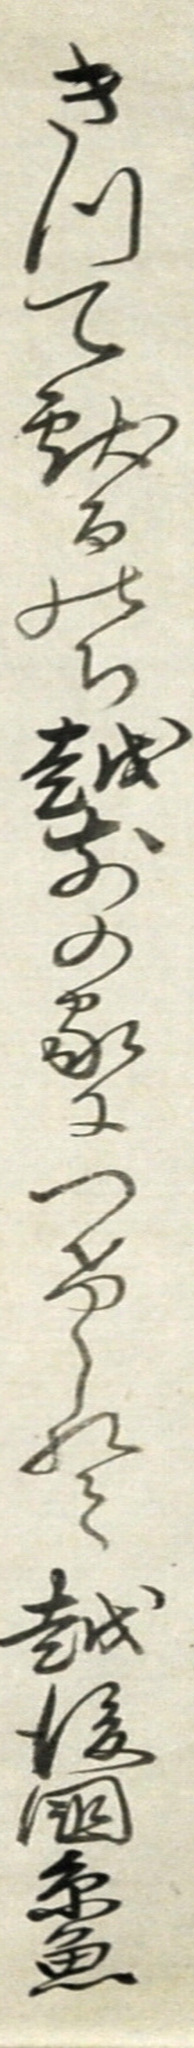きつて献るのち越前の家につけられて越後国糸魚
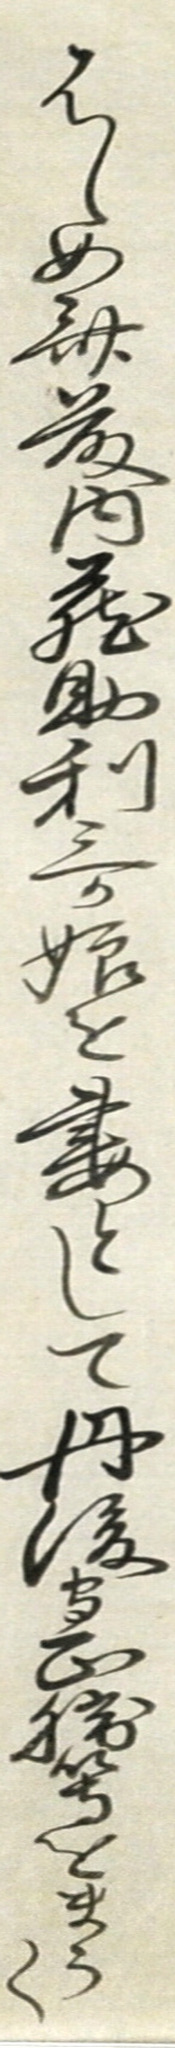はしめ斎藤内蔵助利三か娘を妻として丹後守正勝等をまうく
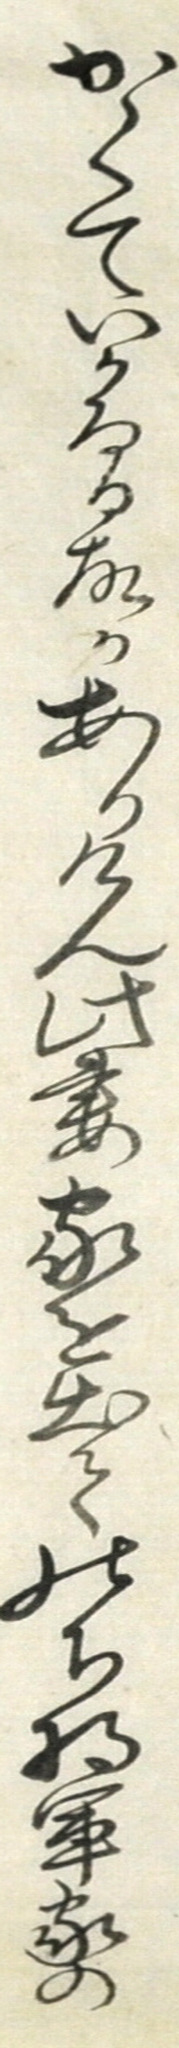かくていかなる故かありけん此妻家を出てのち将軍家の
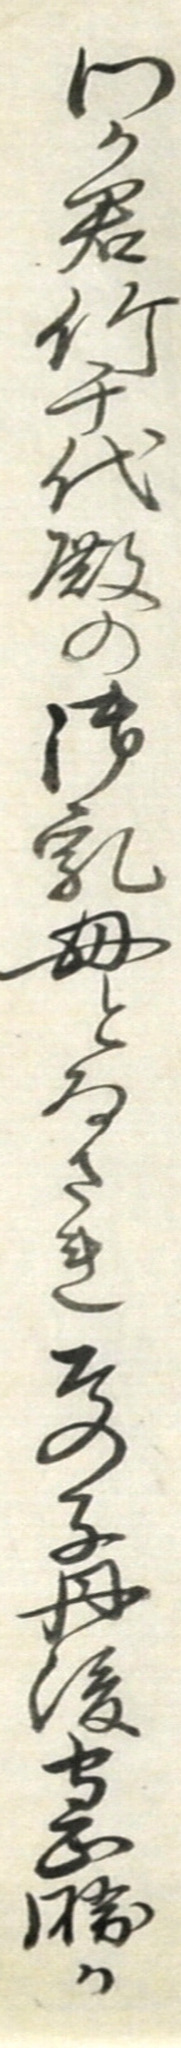わか君竹千代殿の御乳母となされその子丹後守正勝か
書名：藩翰譜（六）
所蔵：伊那市立高遠町図書館・合同会社AMANE
